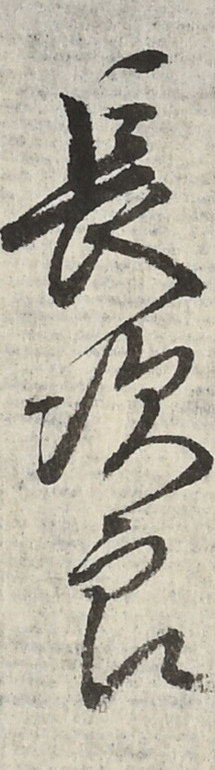長次郎
